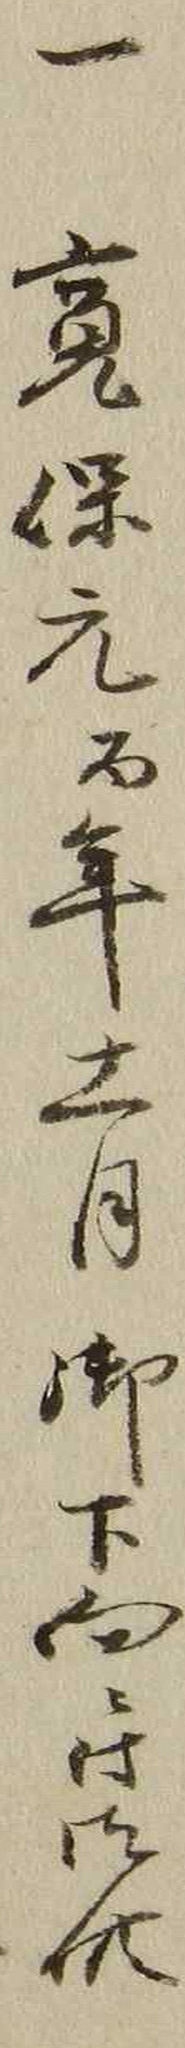一寛保元酉年十一月御下向ニ付御供
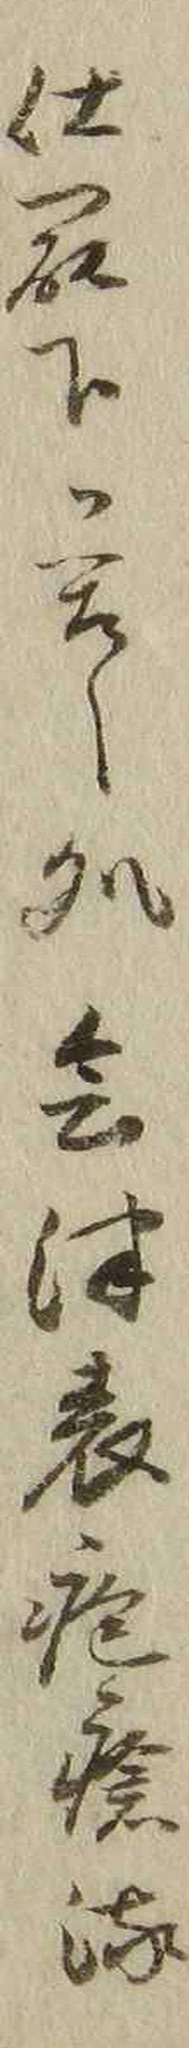仕罷下候筈之処会津表庖瘡流
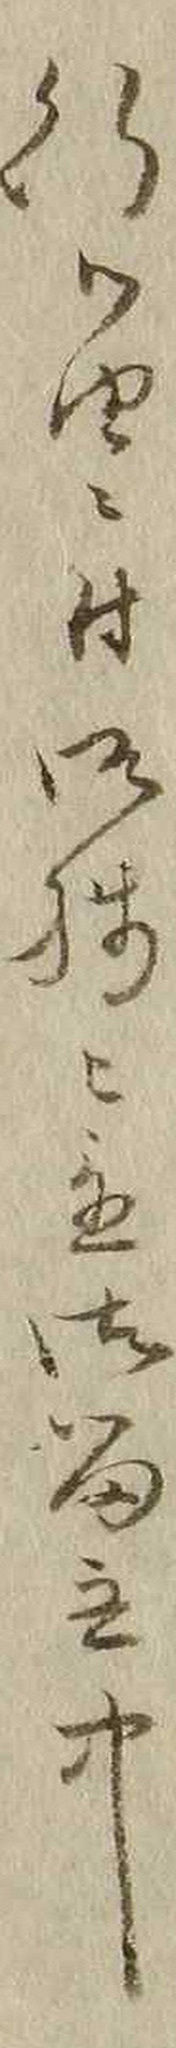行候由ニ付御残被置御留主中
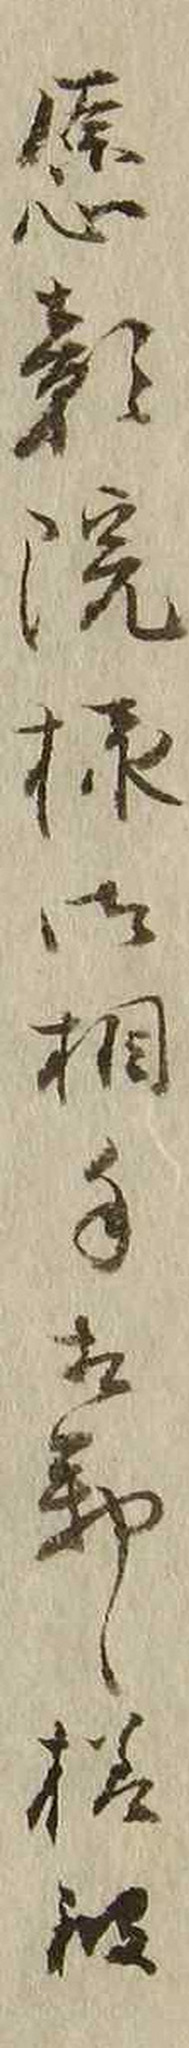愿彰院様御相手相勤候様被
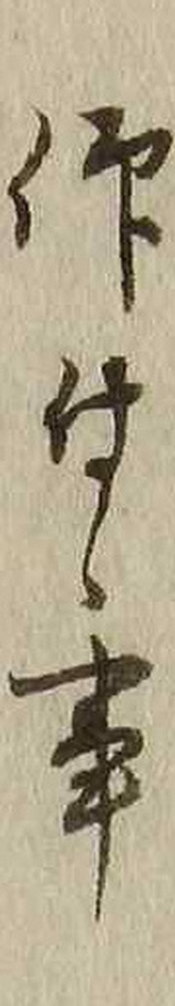仰付候事
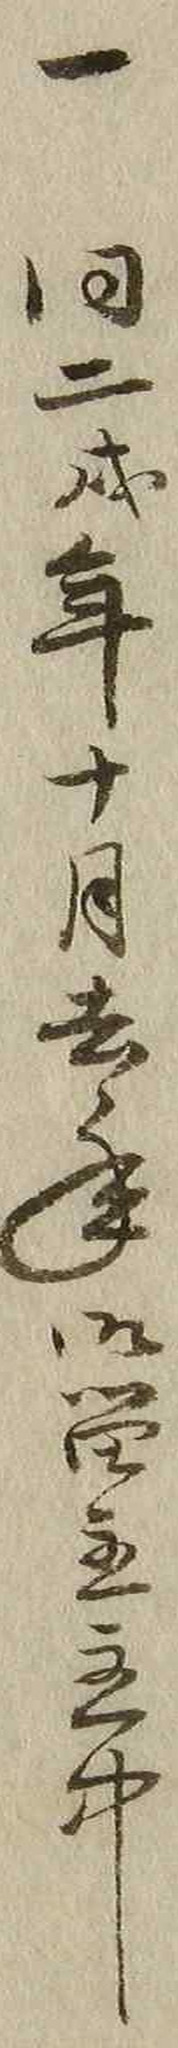一同二戌年十月去年御留主主中
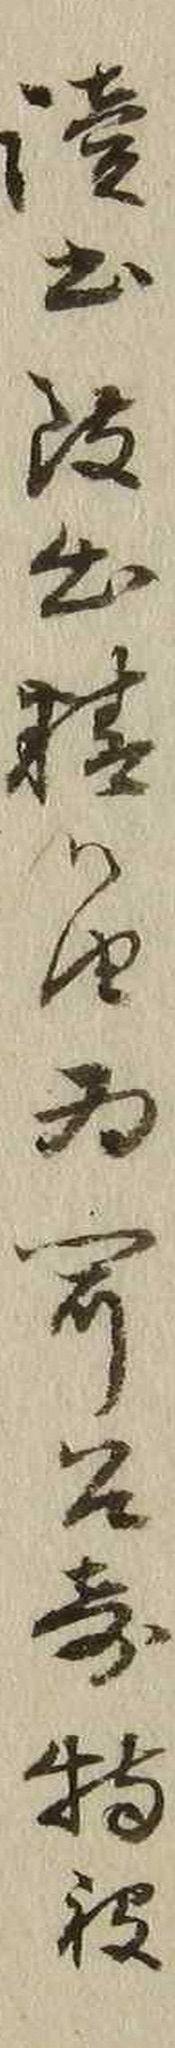読出致出精候由為聞召奇特被
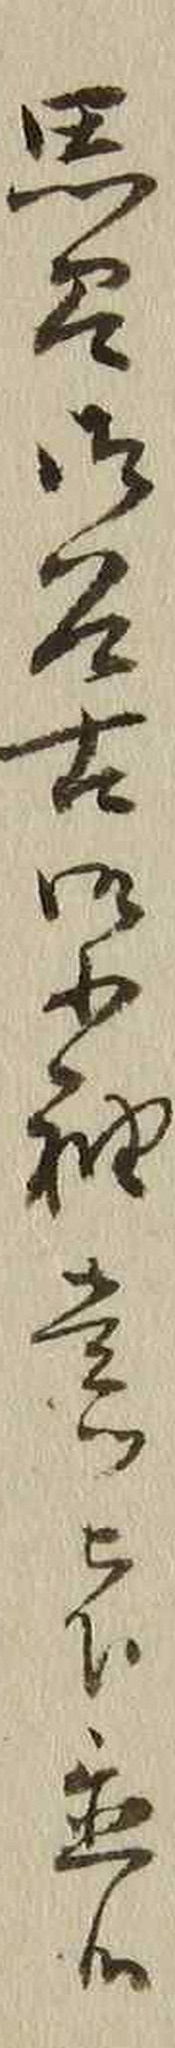思召御召古御小袖壱ツ被下置候
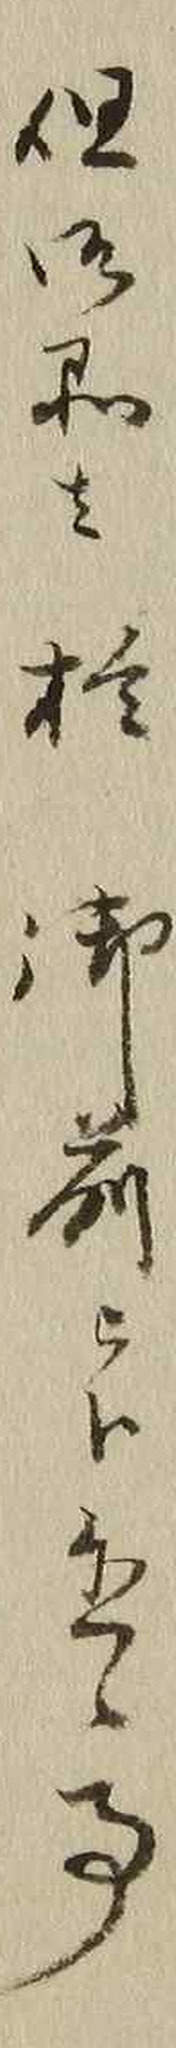但御品は於御前被下置候事
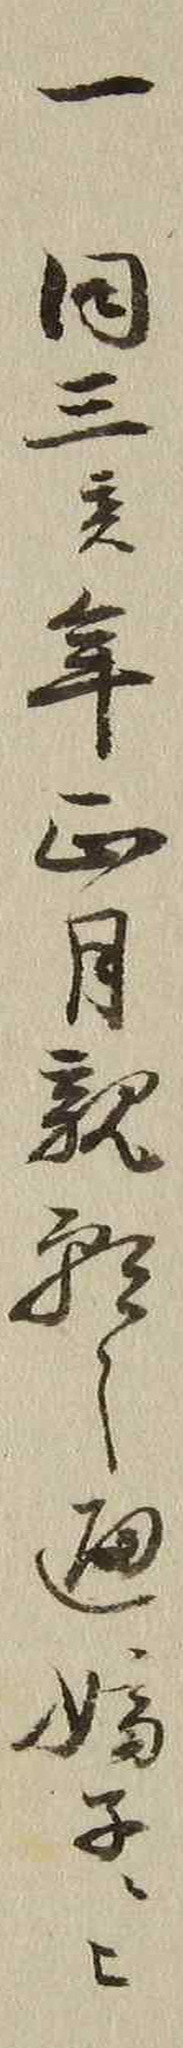一同三亥年正月親願之通嫡子ニ被
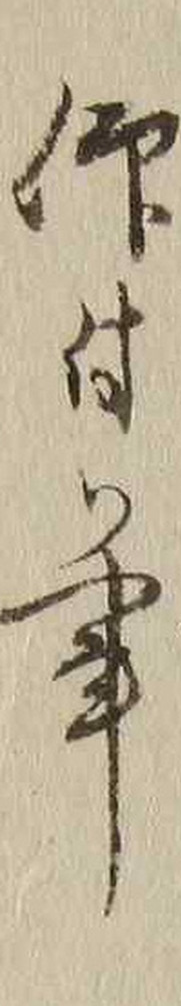仰付候事
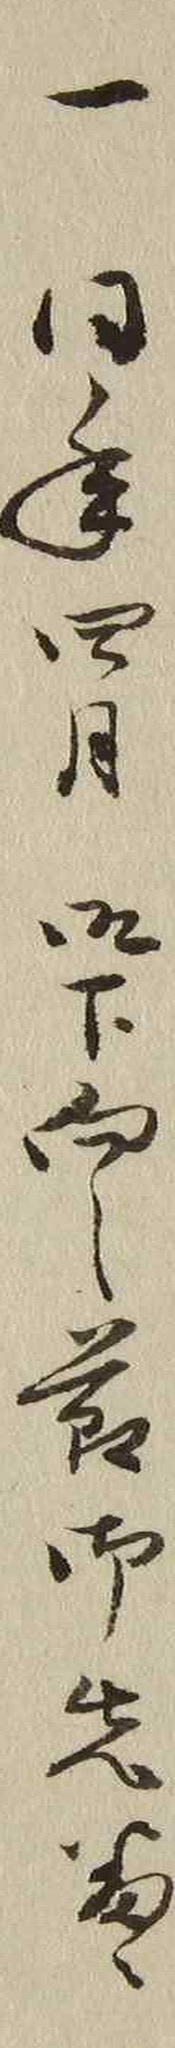一同年四月御下向之節御先番ニ
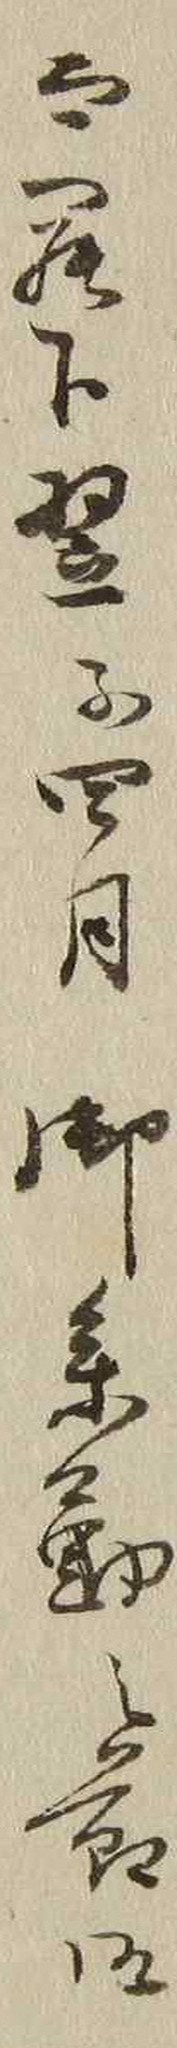而罷下翌子四月御参勤之節御
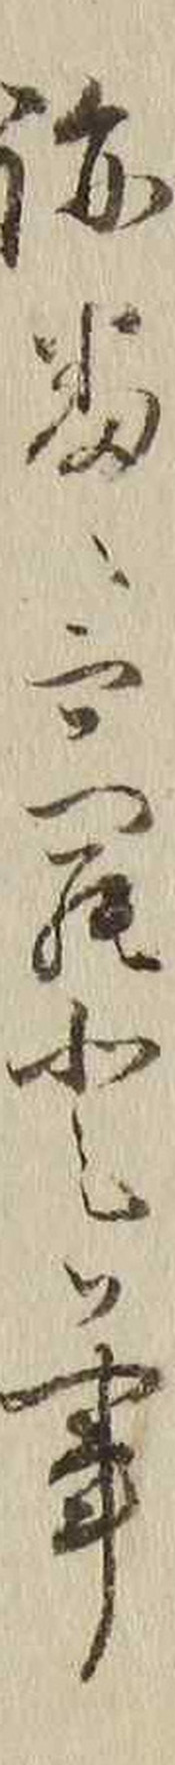跡番ニ而罷登候事
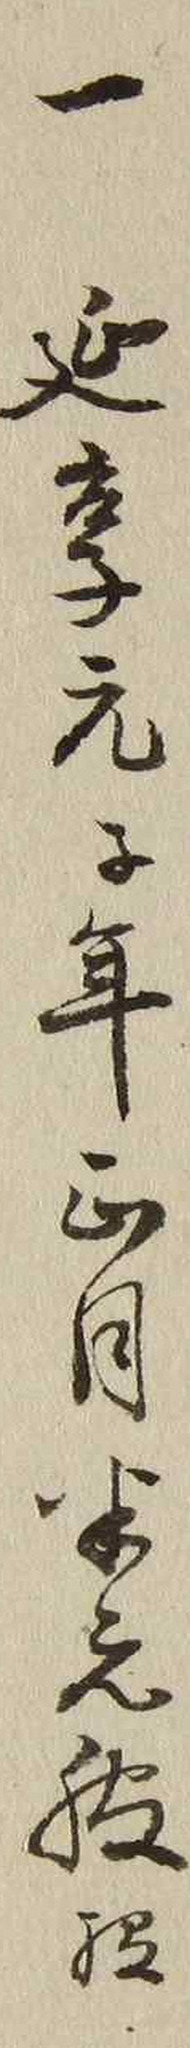一延享元子年正月半元服被
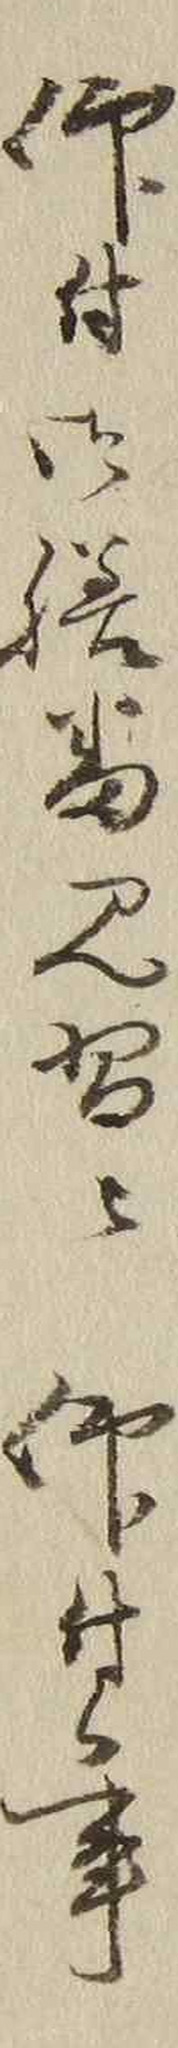仰付御膳番見習被仰付候事
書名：諸士系譜　巻之225　ま之部6
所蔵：会津若松市立会津図書館
